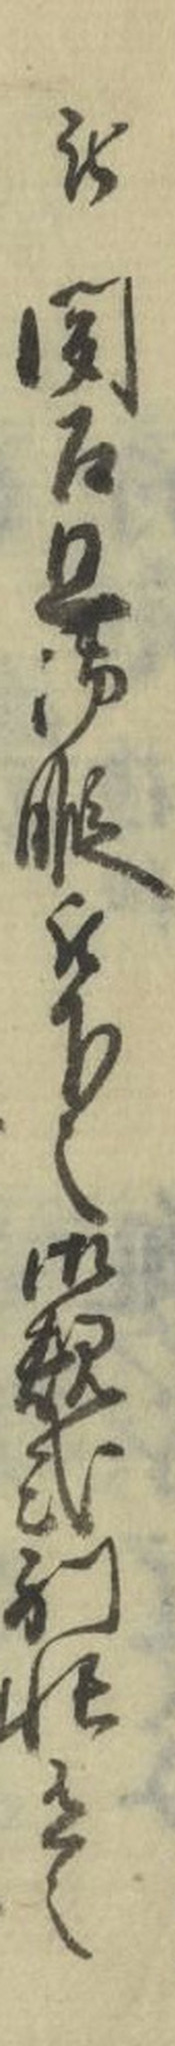被聞召且御暇被下之御規式別帳有之
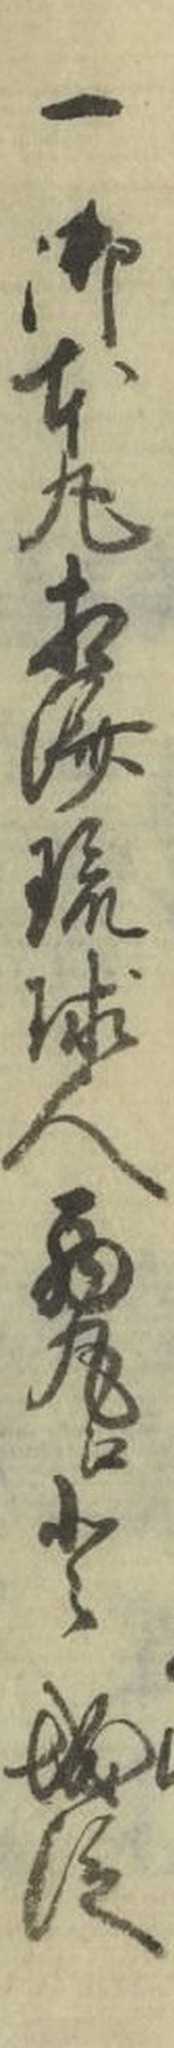一御本丸相済琉球人西丸え登城従
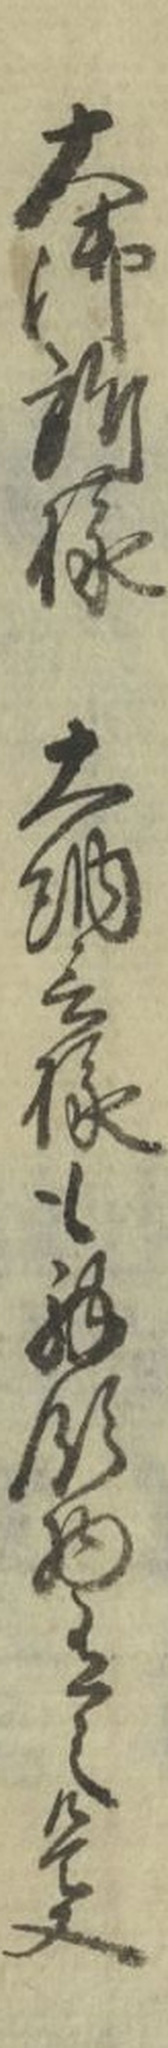大御所様大納言様も拝領物有之是又
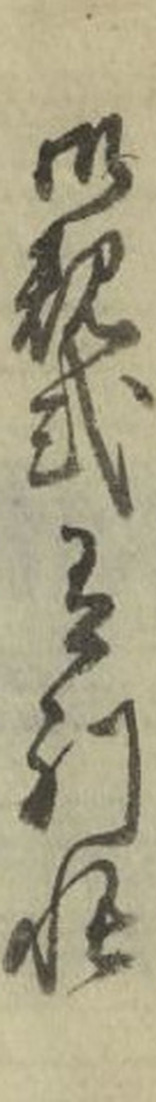御規式有別帳
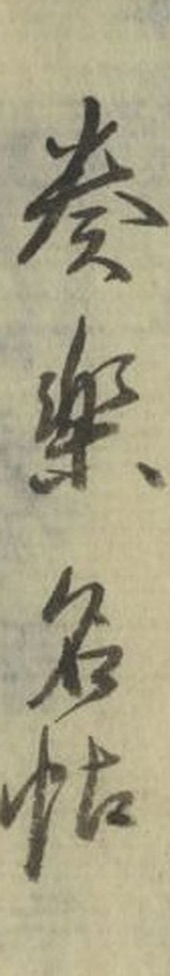奏楽名帖

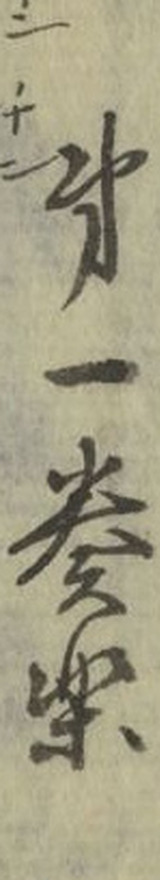第一奏楽
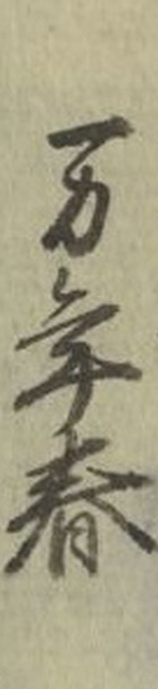万年春
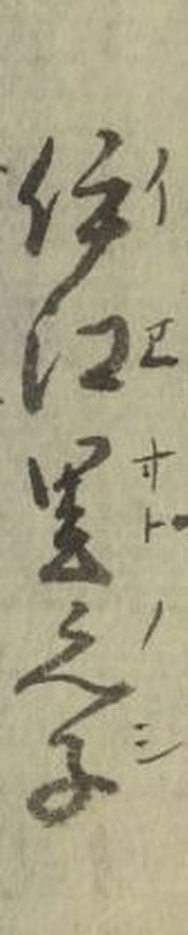笛伊江里之子
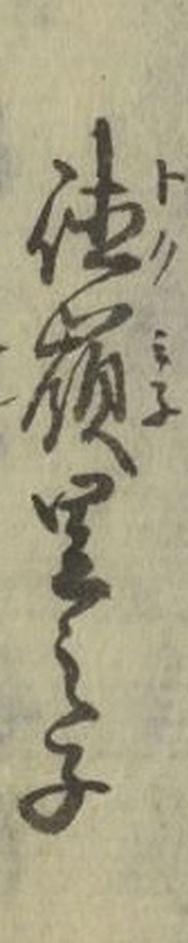笛徳嶺里之子
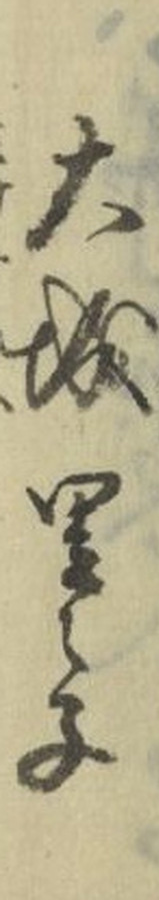韻鑼大城里之子
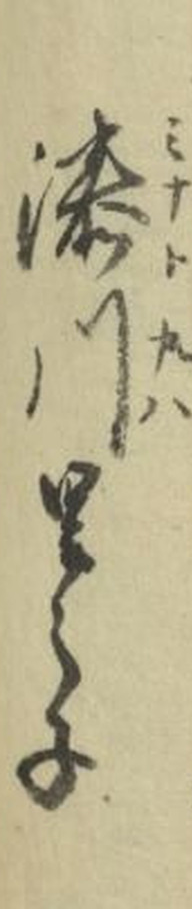挿板湊川里之子
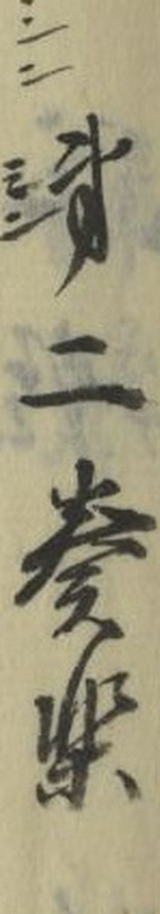第二奏楽
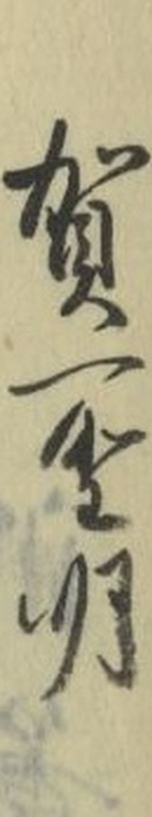賀聖明

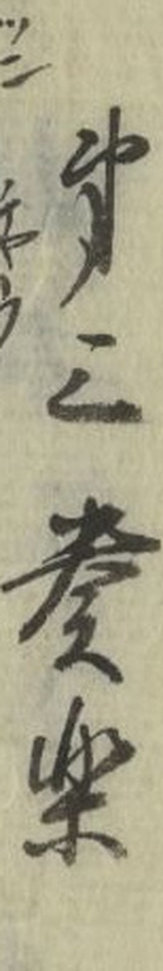第三奏楽
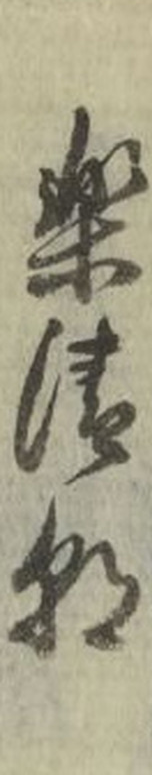楽清朝
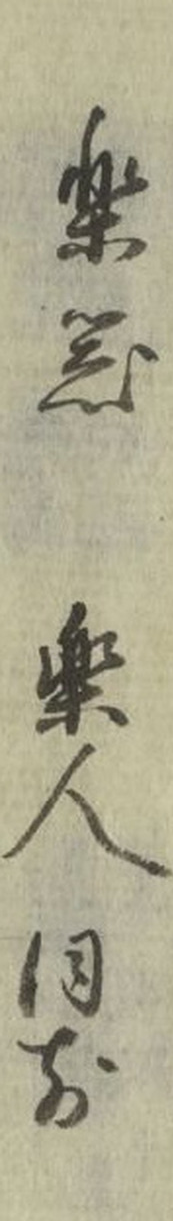楽器楽人同前
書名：戊辰琉球人来朝之式 全
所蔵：University of the Ryukyus Library
